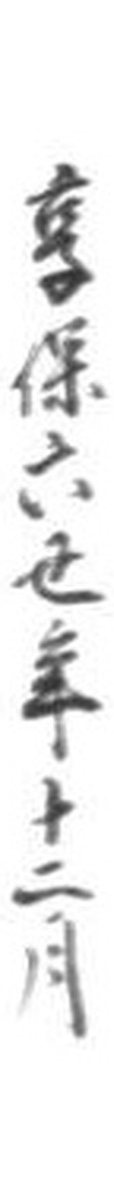享保六丑年十二月

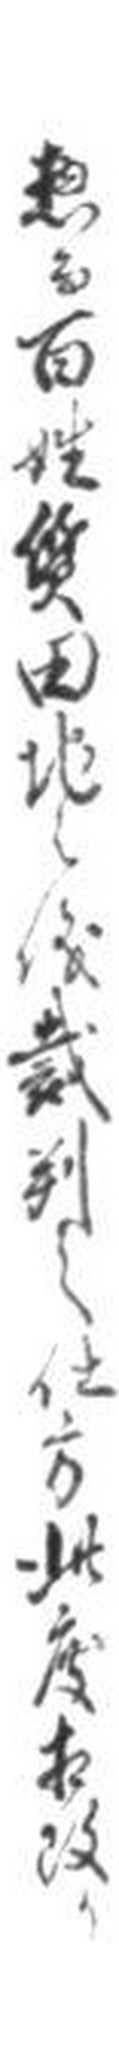惣而百姓質田地之儀裁判之仕方此度相改り
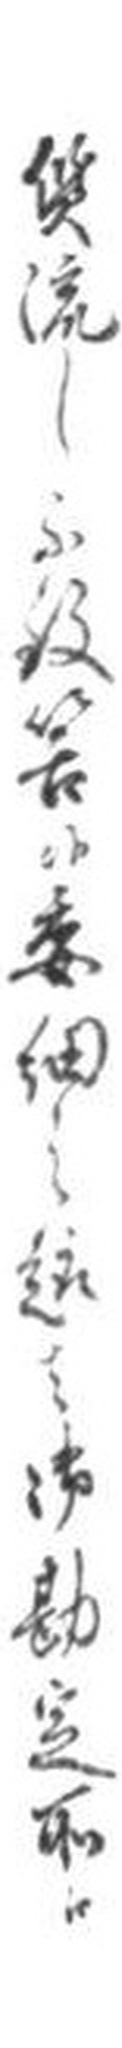質流し不致筈候委細之趣者御勘定所江
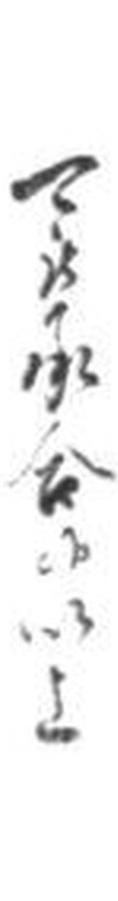可被承合候以上
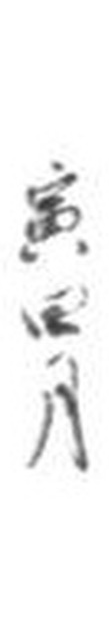寅四月
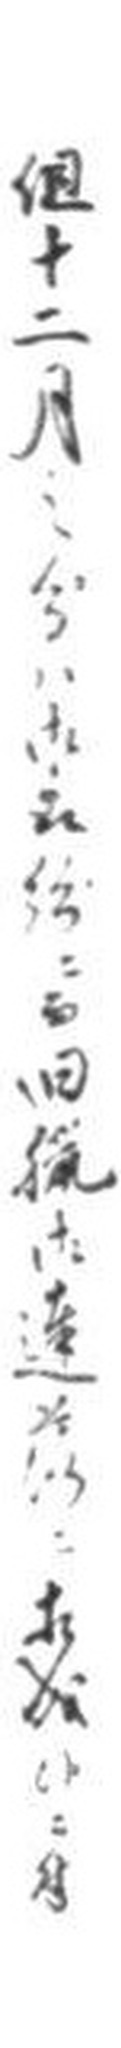但十二月之分ハ御取紛ニ而旧臘御達落ニ相成候ニ付
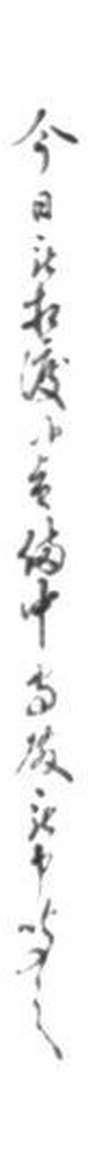今日被相渡候旨備中守殿被申聞之
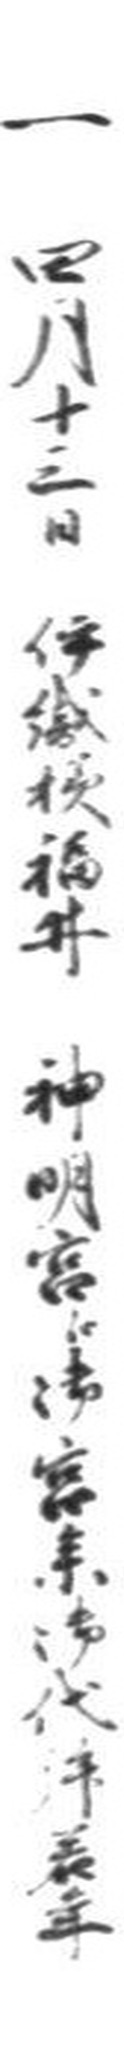一四月十三日伊織様福井神明宮江御宮参御代拝若年
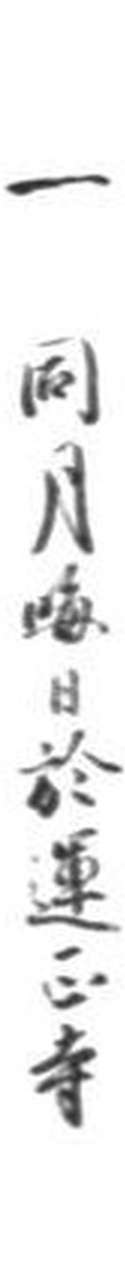一同月晦日於運正寺
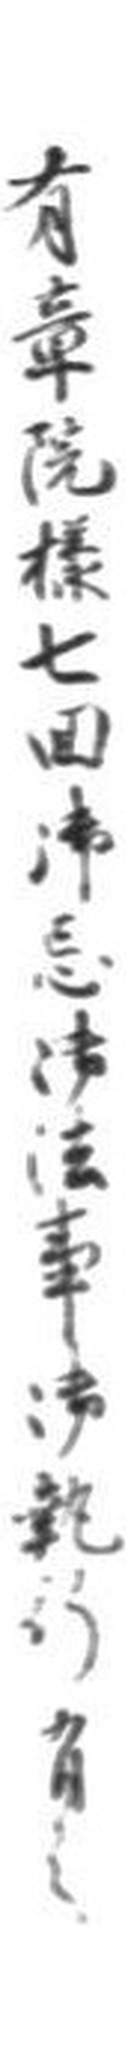有章院様七回御忌御法事御執行有之
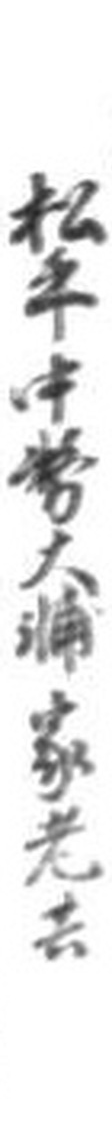松平中務大輔家老共
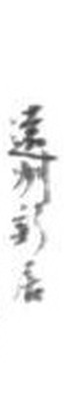遠州新居

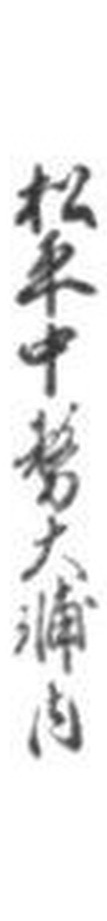松平中務大輔内
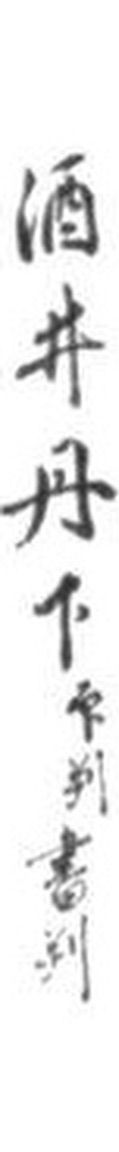酒井丹下印判書判
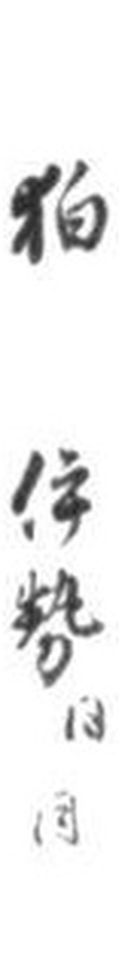狛伊勢同同
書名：家譜 三十五 宗昌公 従享保六年到同七年
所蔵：福井県文書館 Fukui Prefectural Archives
